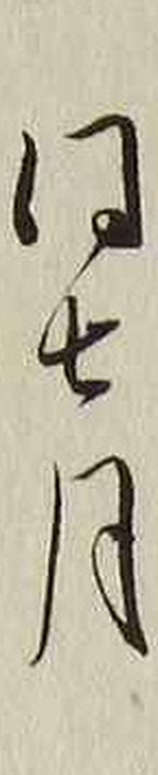同七月
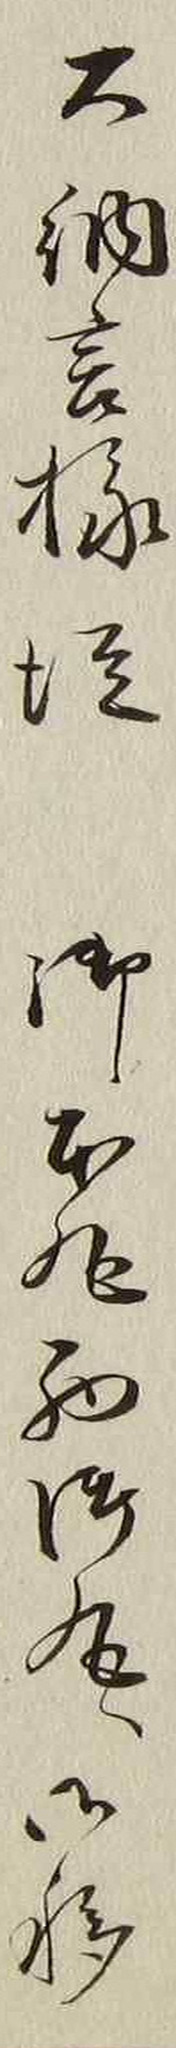大納言様御本丸より西御丸へ御移り
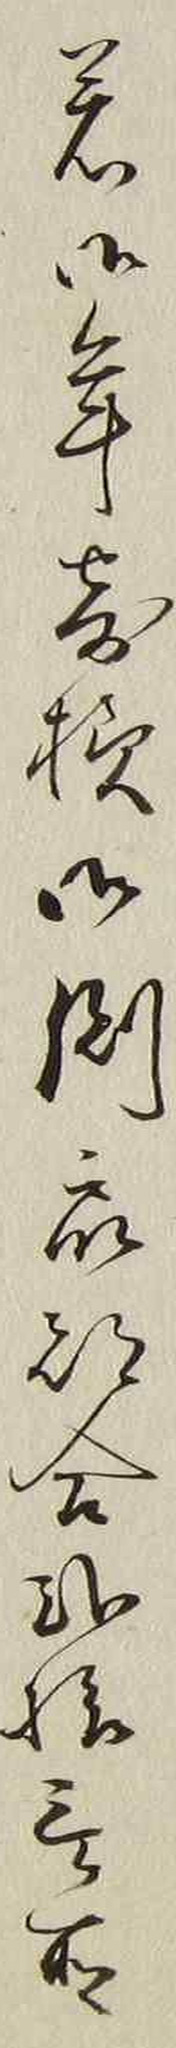若御年寄様御側衆都合弐拾三ケ所へ
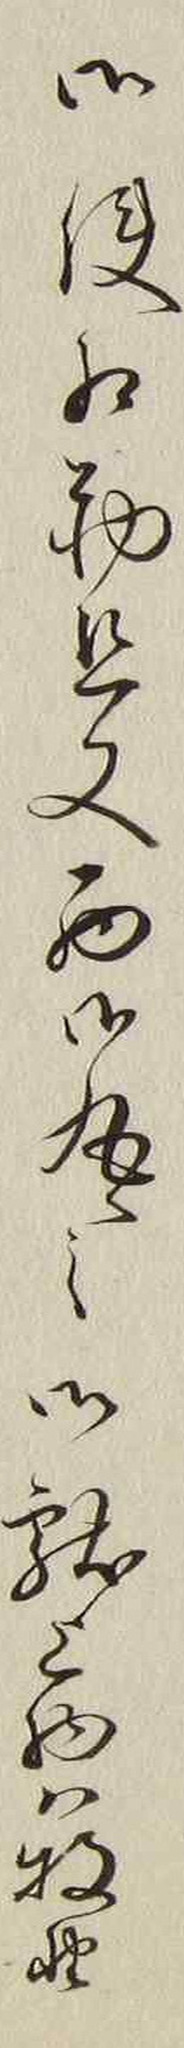御使い相勤め且又西御丸之御献上物ㇵ牧野
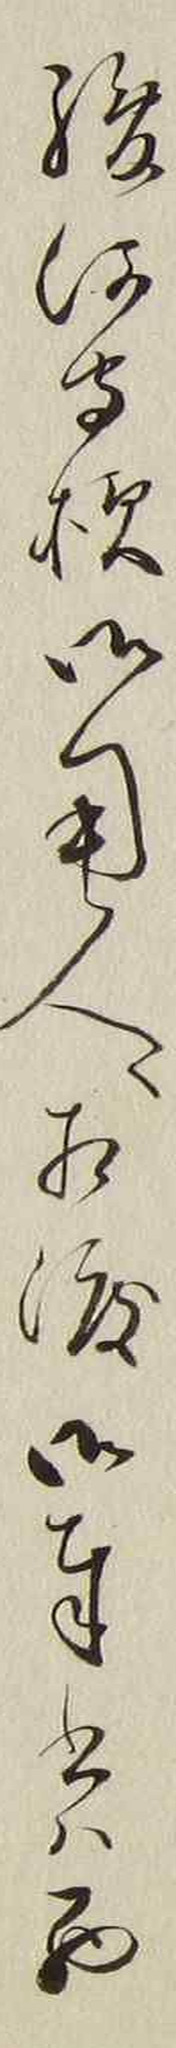駿河守様御用人へ相渡し御奉公ㇵ西

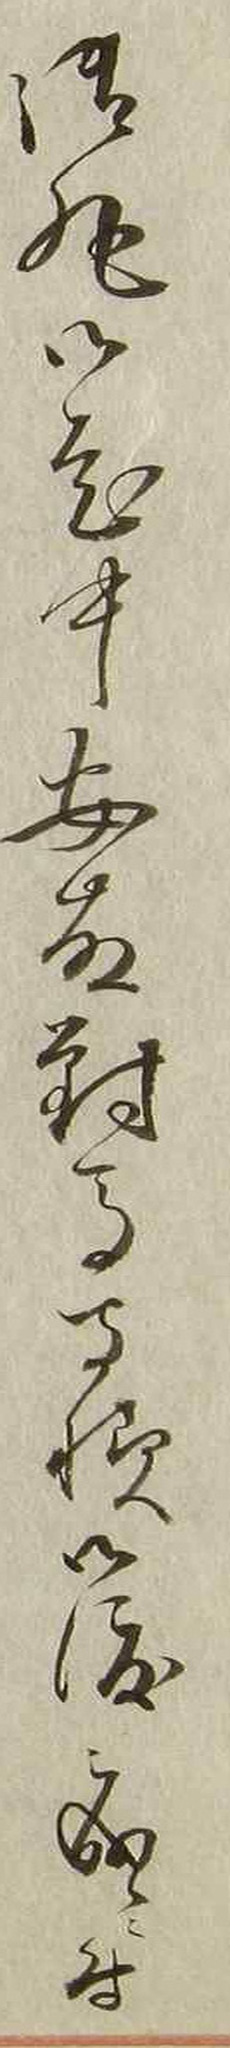御丸御老中安藤対馬守様御渡り成られ候ニ付き
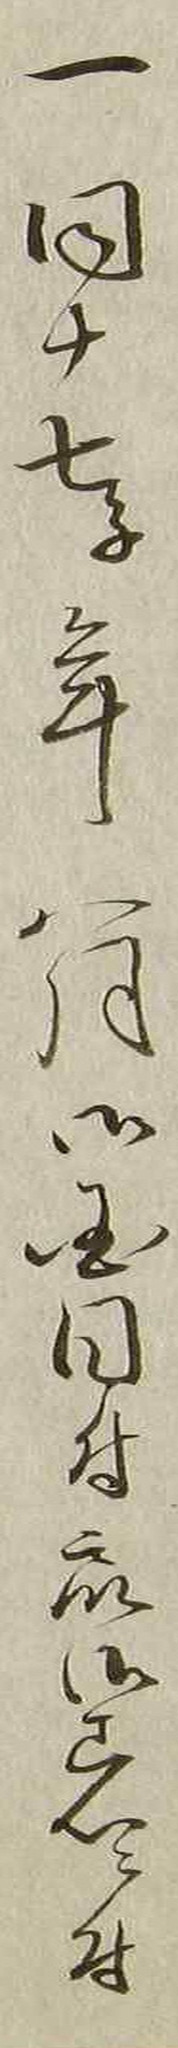一同十七子年八月こ御国目付衆御着ニ付き
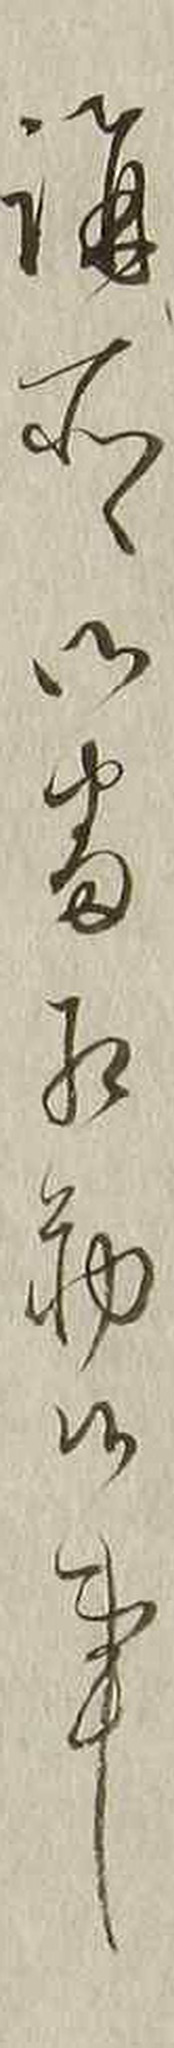講所へ御番相勤め候事
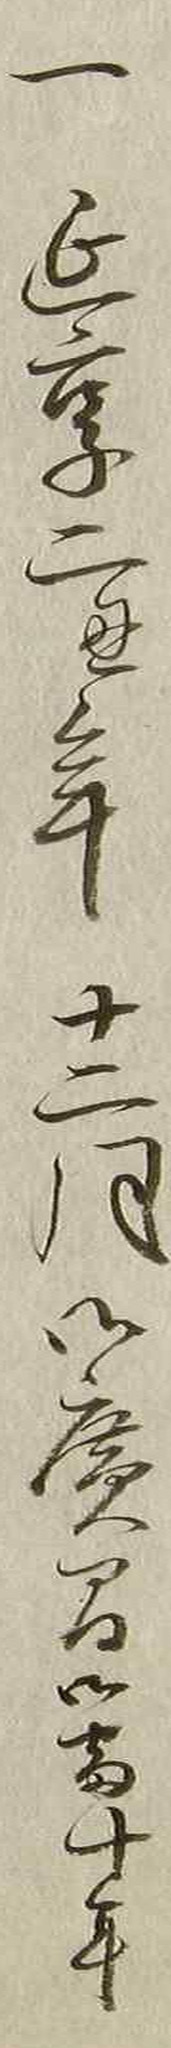一延享二丑年十二月御広間御番十年
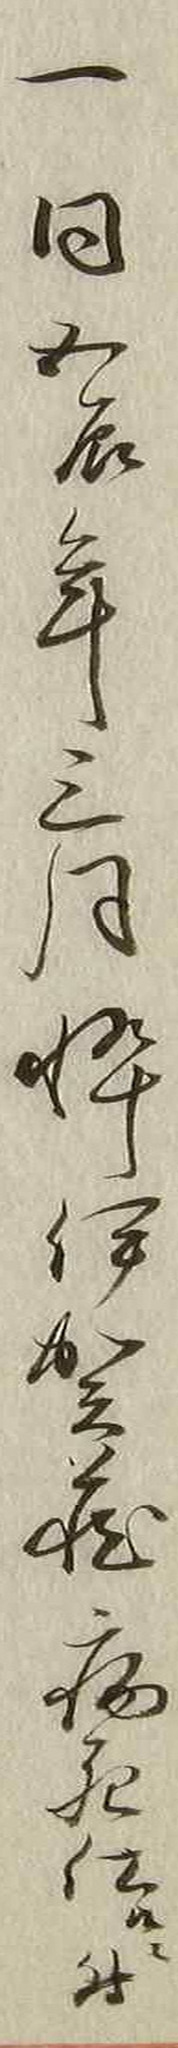一同五辰年三月倅伊賀蔵病死仕り候二付き
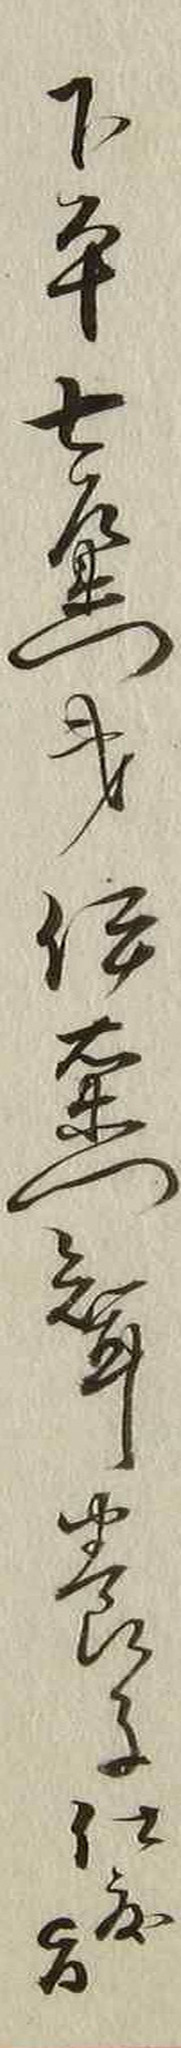下平七左衛門弟伊右衛門婿養子仕り度旨
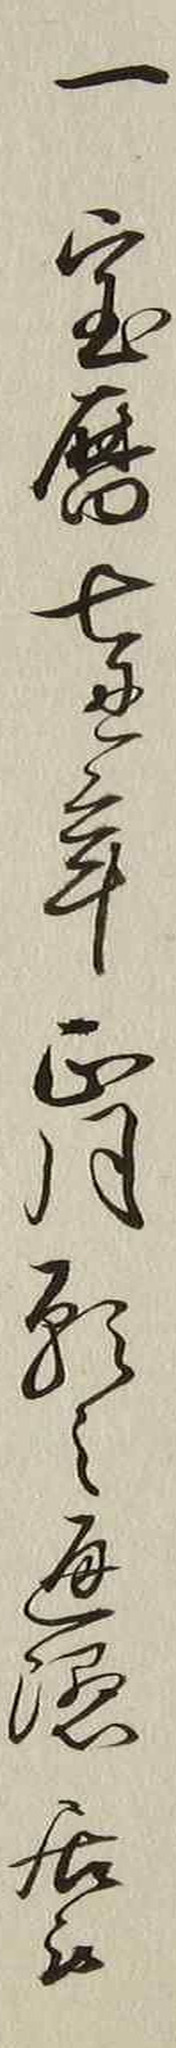一宝暦七丑年正月願い之通隠居
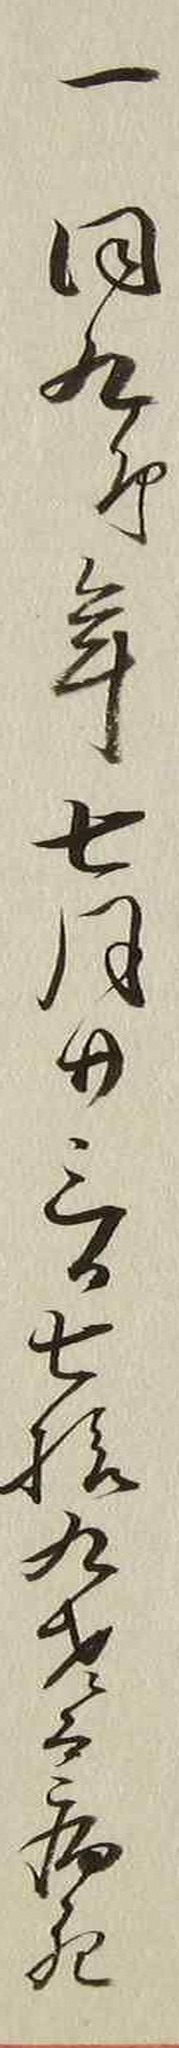一同九卯年七月廿三日七拾九才ニて病死
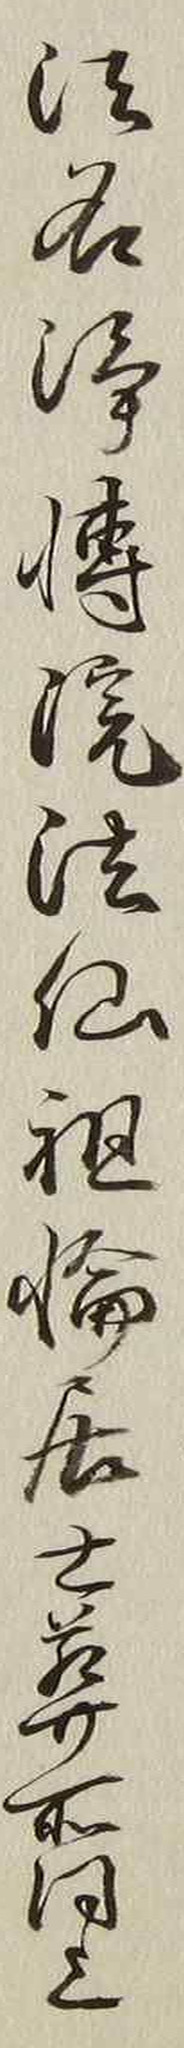法名浄転院法祖輪居士葬所同上
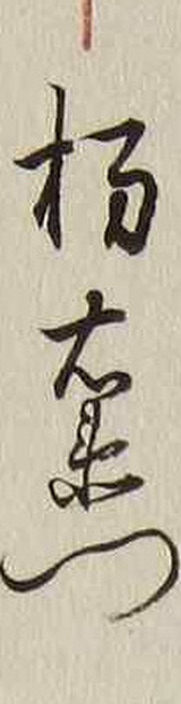栢右衛門
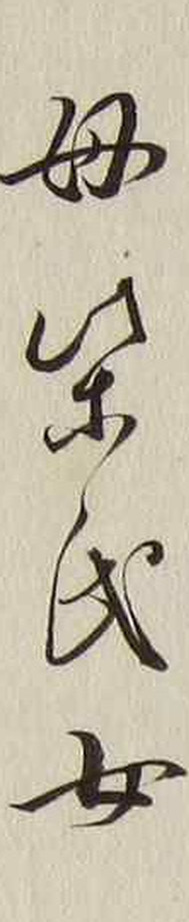母柴氏女
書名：諸士系譜　巻之20　い之部20
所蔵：会津若松市立会津図書館
